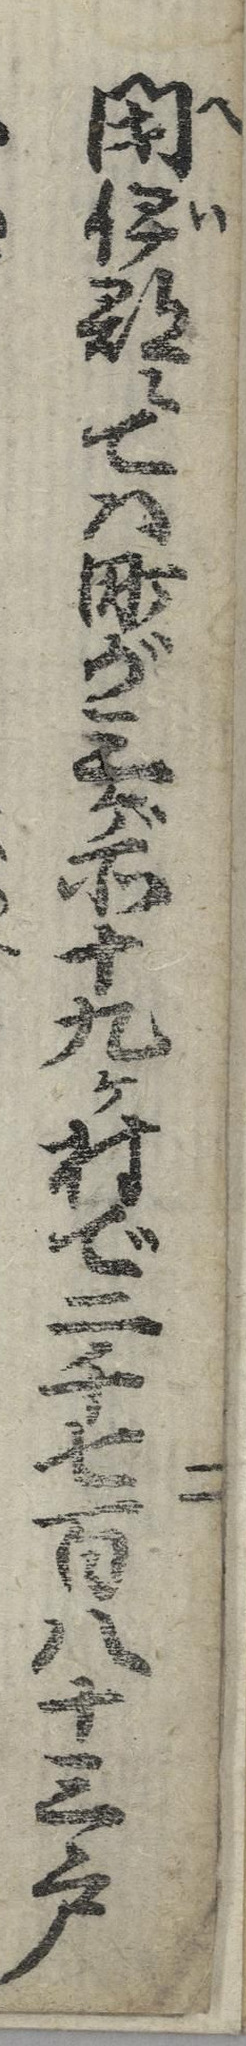閉伊郡にては町が三ヶ所十九ヶ村で二千七百八十三戸
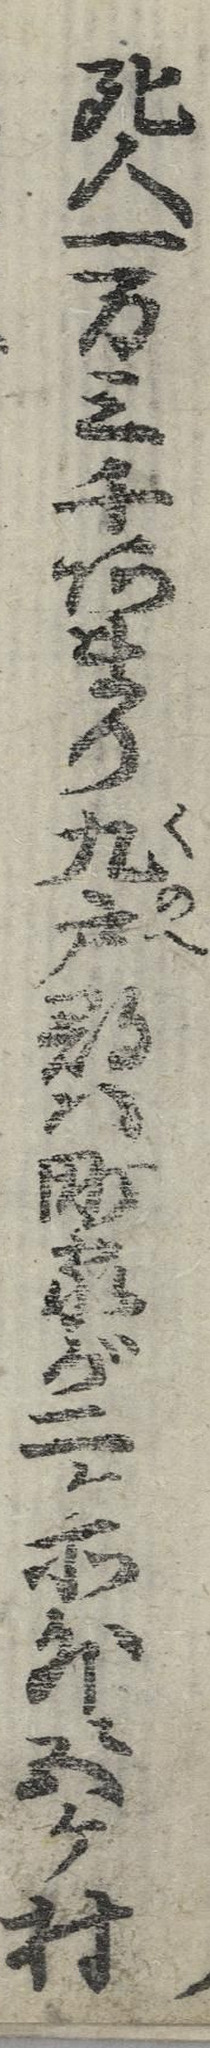死人一万三千あまり九戸郡は町家が二ヶ所外に五ヶ村
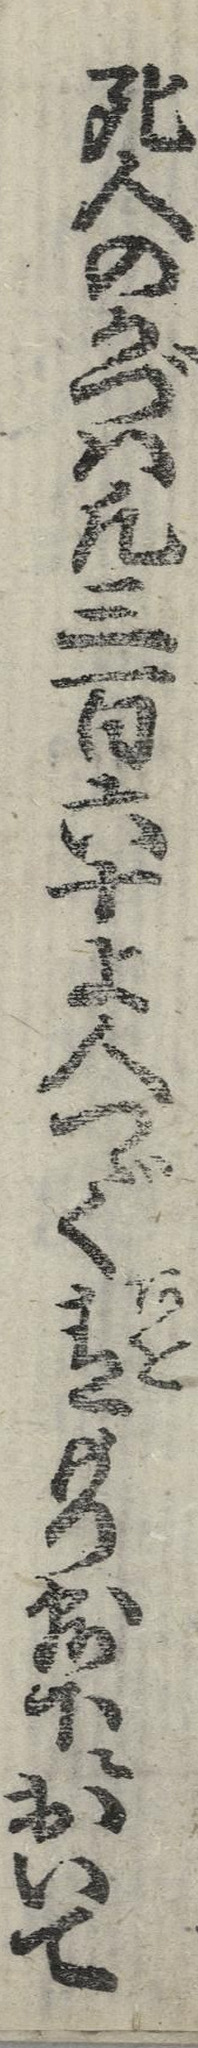死人のかづは凡三百六十よ人つゞく青もり県下において
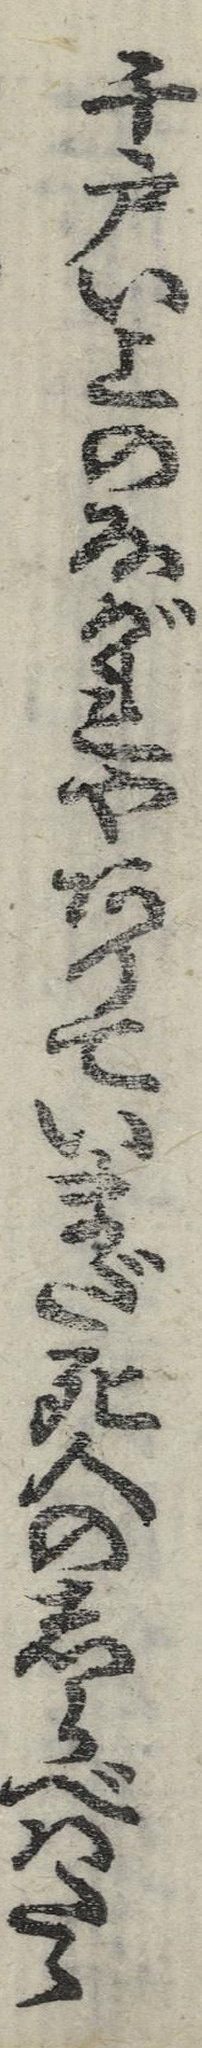千戸い上のながれやありていまだ死人のしらべはたゝ
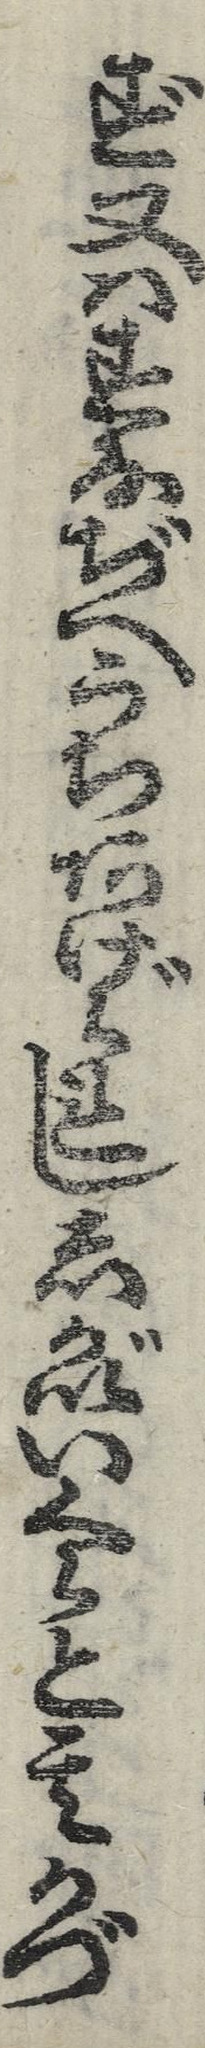ず又はすなぢへうちあげられししがいいくらと其かづ
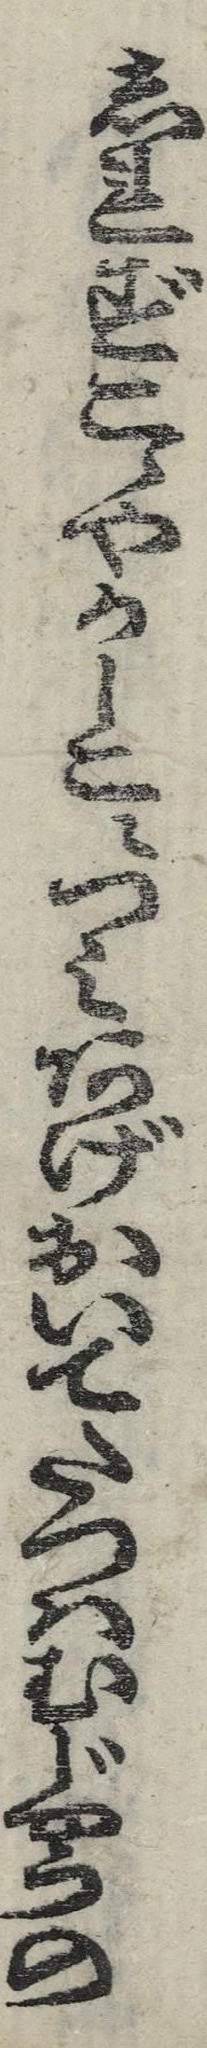しれずこゝやかしこにつみあげおいてたつはむじやうの
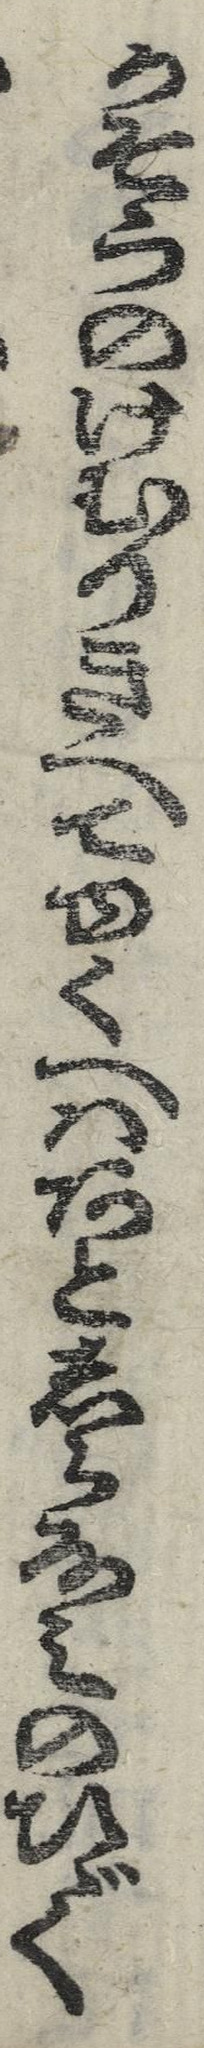かそうのけむりきへてゆくへはあとしらなみのひゞく
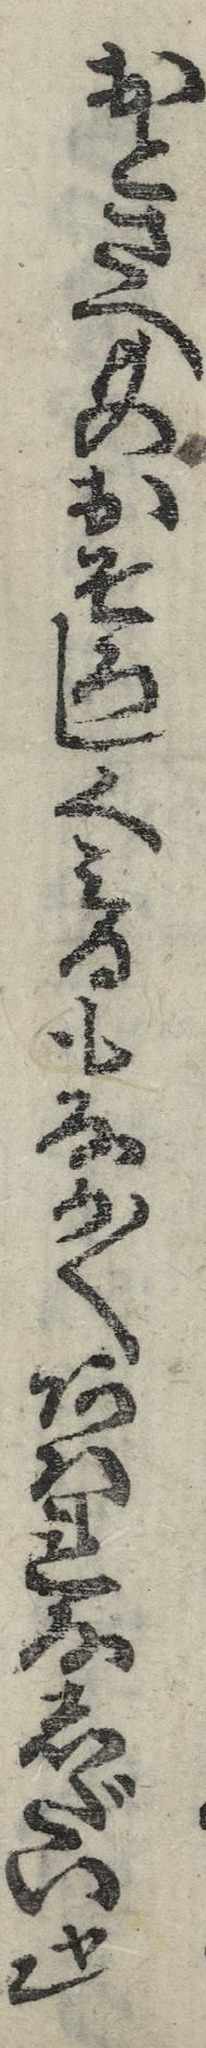おとさへものおそろしくもゐもなか〳〵あはれなしだいヤレ
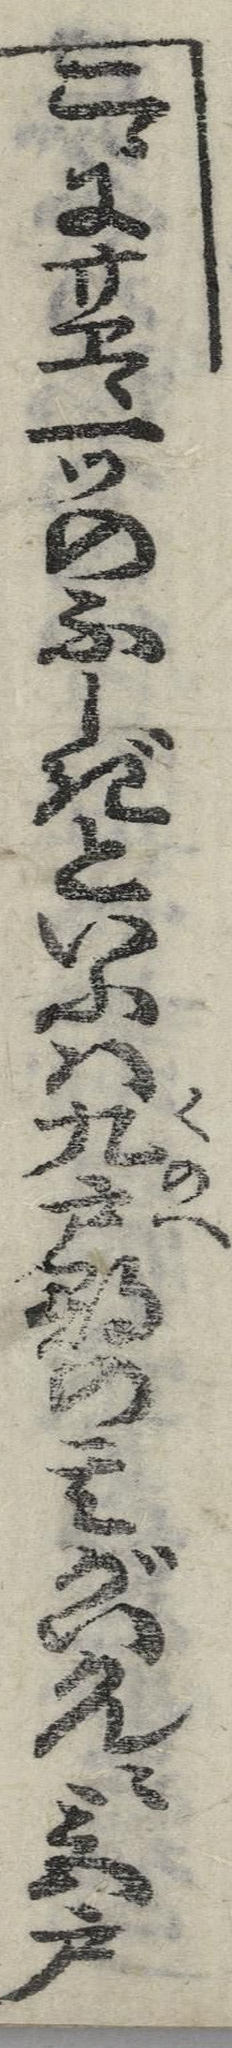〽こゝにサヱヽ一つのふしぎといふは九戸郡の其がいかんに宮戸
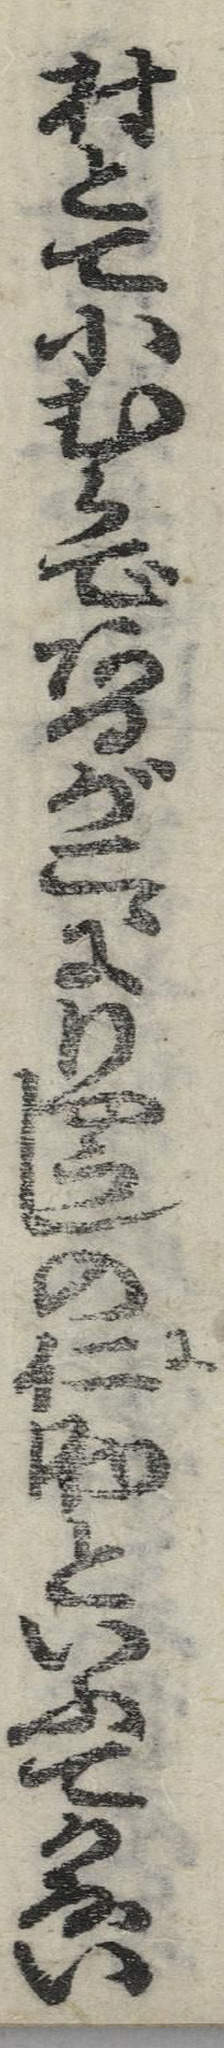村とて小むらであるがこゝにりやうしの仁助といふてかない
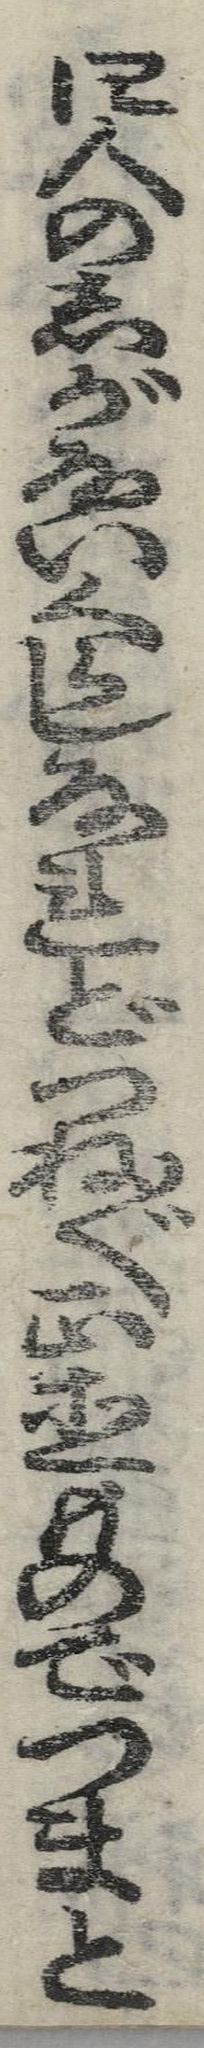四人のしがないくらしなれどつね〴〵正直ものでつまと
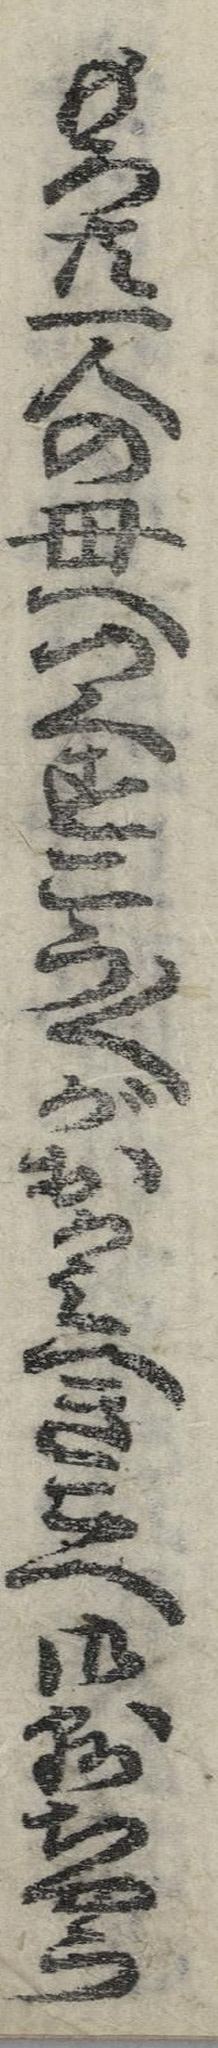もろ共一人の母へつくすこう〳〵がおかみへきこへ御県ちやう
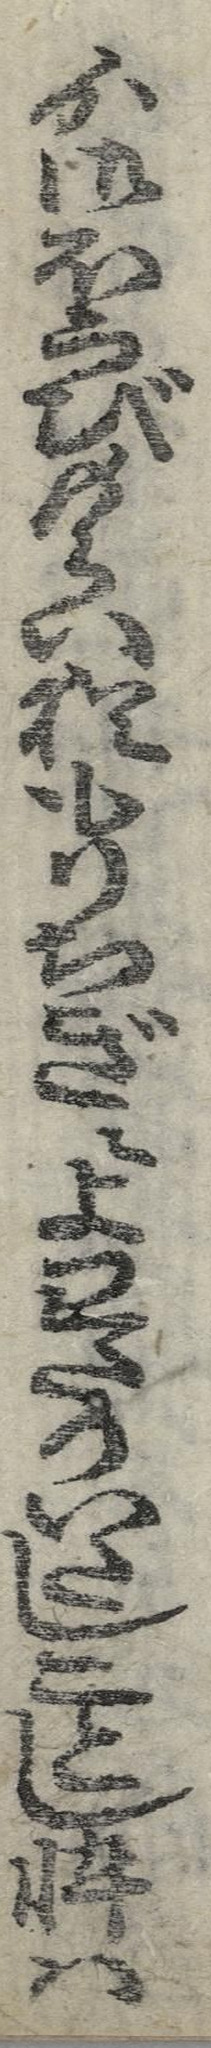ゟ御ほうびもらい猶もりちぎによわたりいたしことし忰は
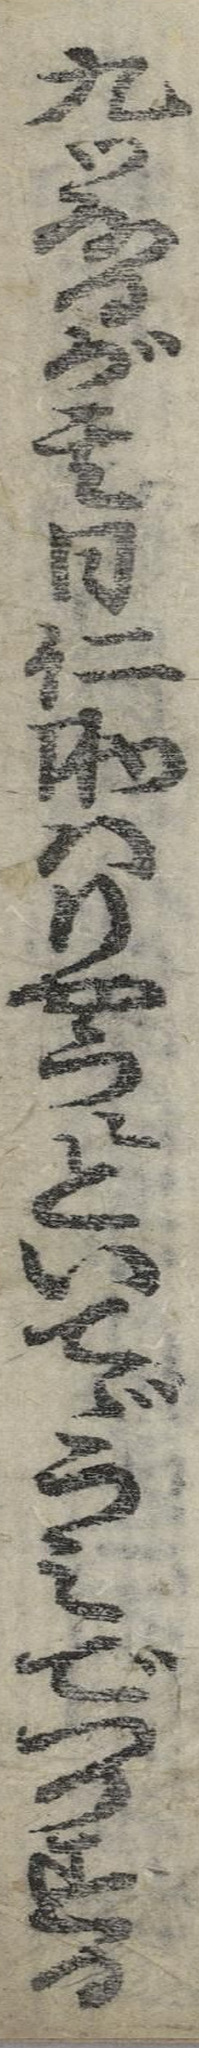九つなるが其日仁助はりやうにといてゞうみでつりする

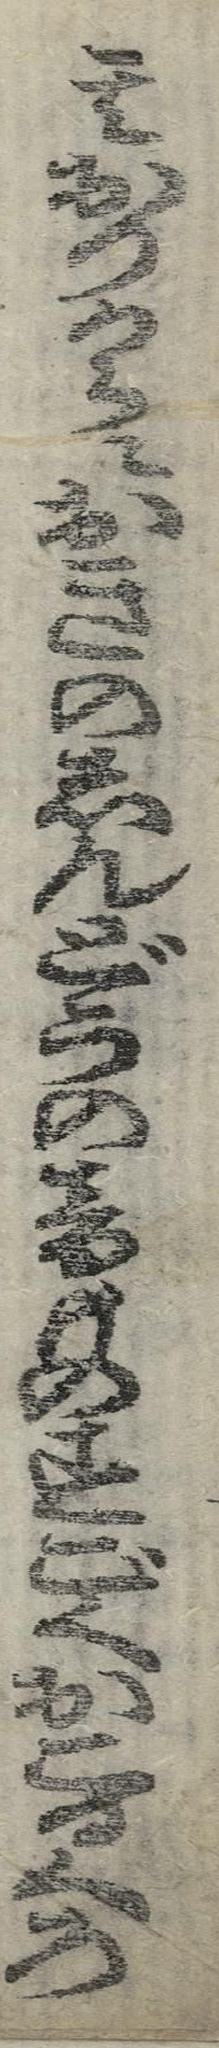其おりからにおきのしんどうの音ものすごくおこるくろ
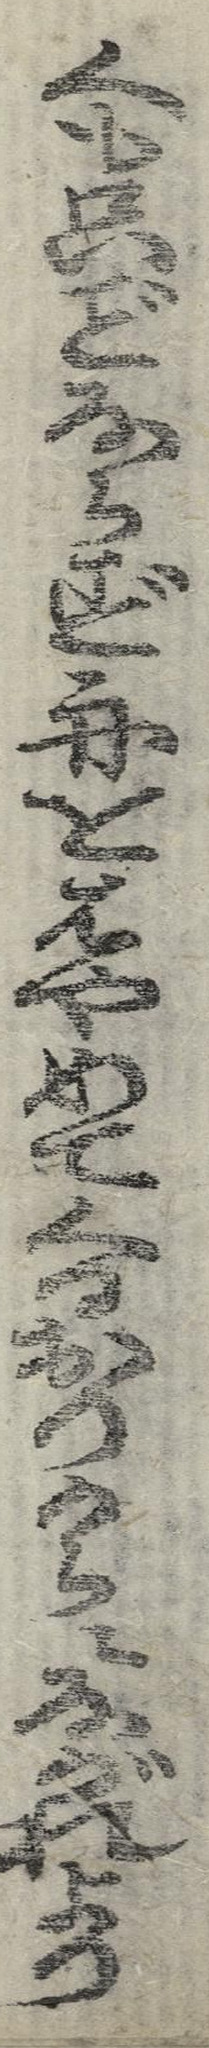くも只ごとならず舟をはやめてくるおりからにながれより
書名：奥州すじ大つなみおおあれくどき
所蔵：東京大学地震研究所図書室 Earthquake Research Institute Library, The University of Tokyo, JAPAN
